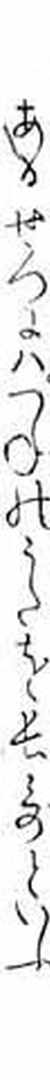あるせつには。つねのうたを長歌といふ。
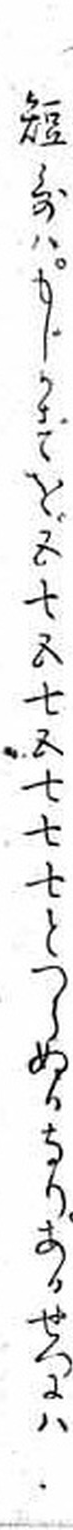短哥は。もじかずを。五七五七五七七七とつらぬるなり。あるせつには

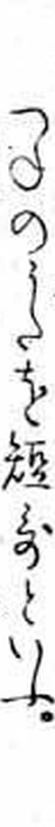つねのうたを短哥といふ。
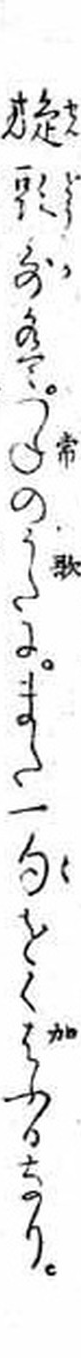旋頭哥は。つねのうたに。また一句をくはふるなり。
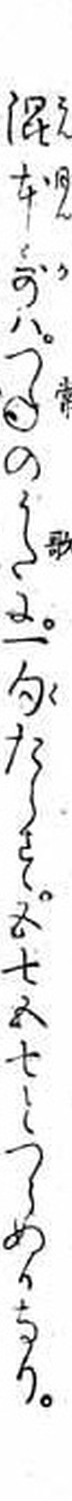混本哥は。つねのうたに。一句たらす。五七五七とつらぬるなり。
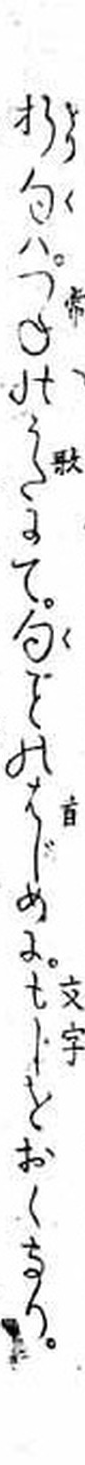折句は。つねのうたにて。句ごとのはじめに。もじをおくなり。
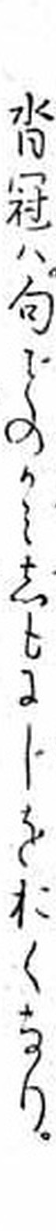沓冠は。句ごとのかみしもにじをおくなり。
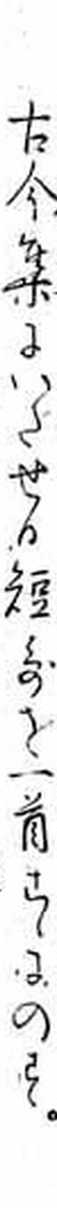古今集にいだせる短哥を一首こゝにのす。
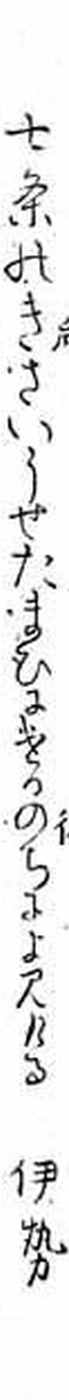七条のきさいうせたまひにけるのちによみける伊勢
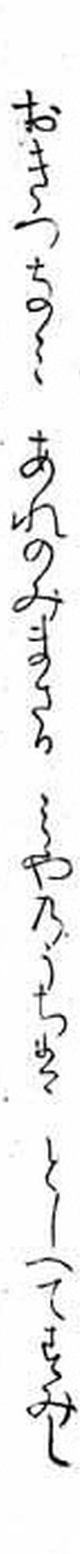おきつなみあれのみまさるみやのうちはとしへてすみし
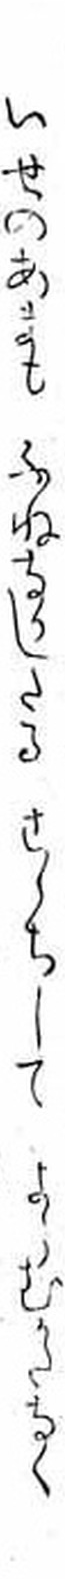いせのあまもふねなかしたるこゝちしてよらむかたなく
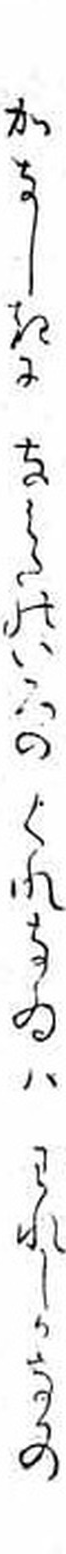かなしきになみたのいろのくれなゐはわれしかなかの
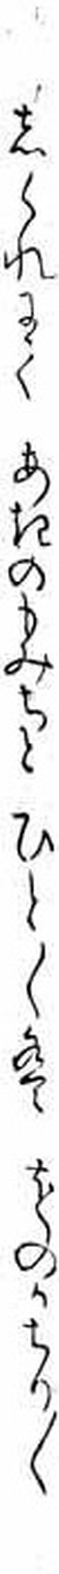しくれにてあきのもみちとひと〳〵はをのかちり〳〵
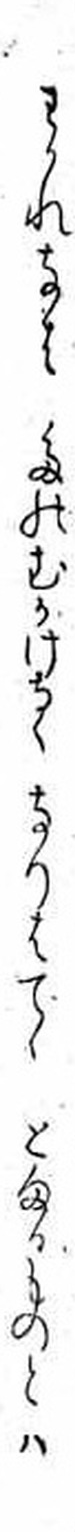わかれなはたのむかけなくなりはてゝとまるものとは
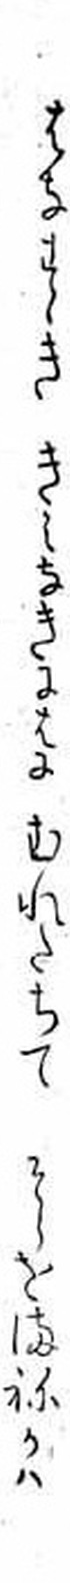はなすゝききみなきにはにむれたちてそらをまねかは
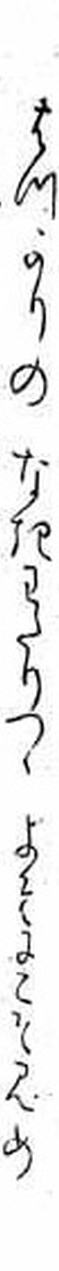はつかりのなきわたりつゝよそにこそ見め
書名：女学範
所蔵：東京学芸大学教育コンテンツアーカイブ
